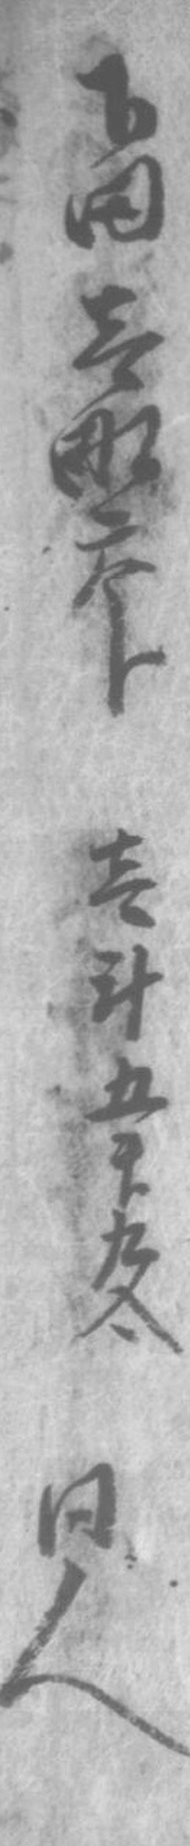下田壱畝六分壱斗五升九合同人
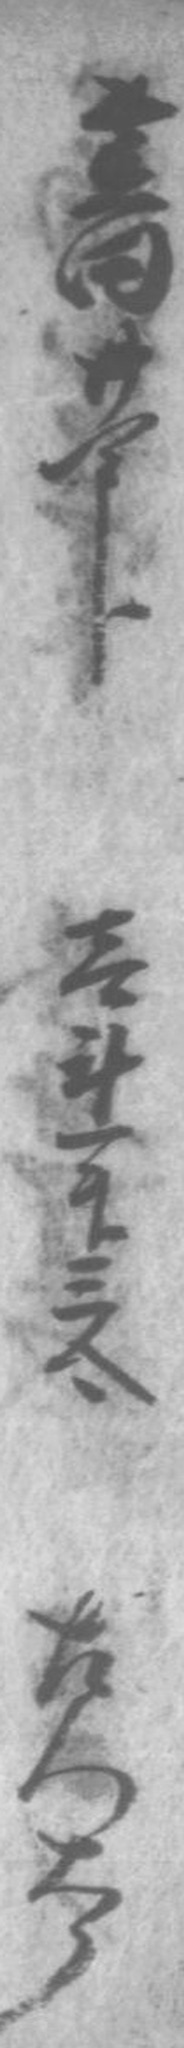荒田廿四分壱斗一升三合左衛門太郎
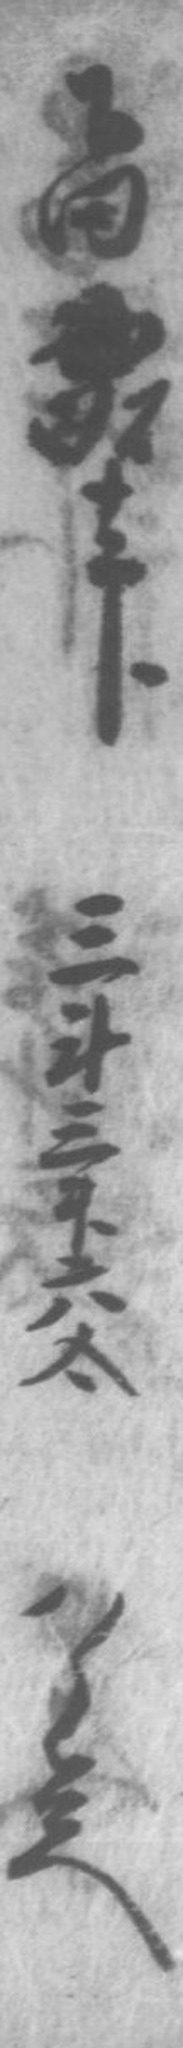下田弐畝十二分三斗三升六合八郎兵衛
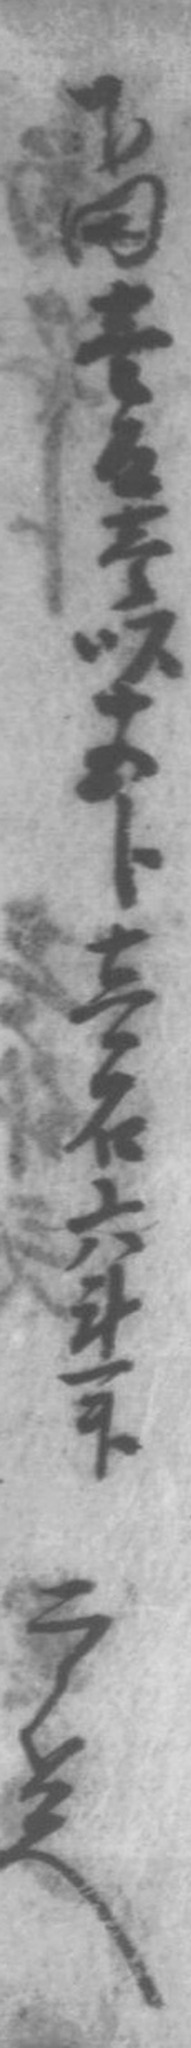下田壱反一畝十五分壱石六斗壱升二郎兵衛
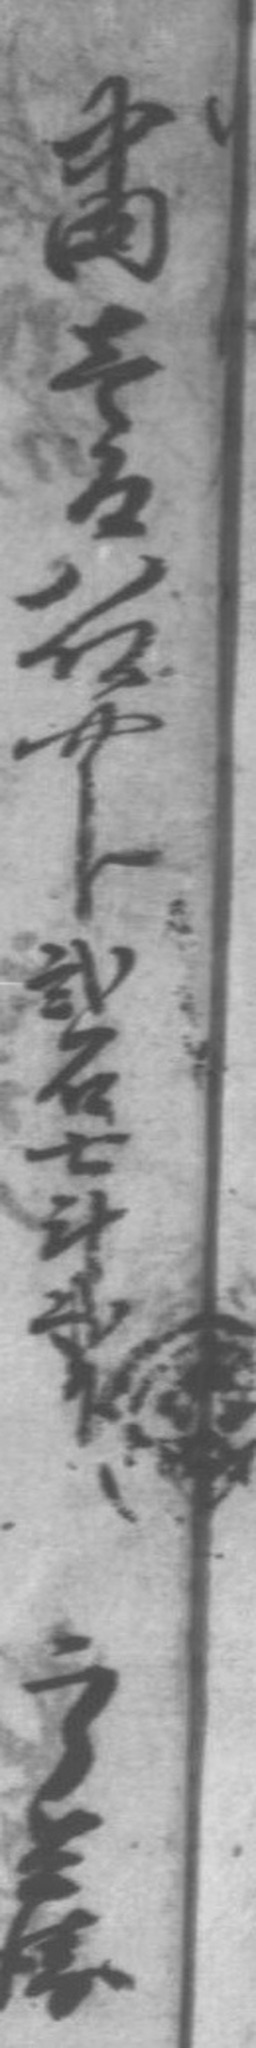中田壱反八畝四分弐石七斗弐升二郎兵衛
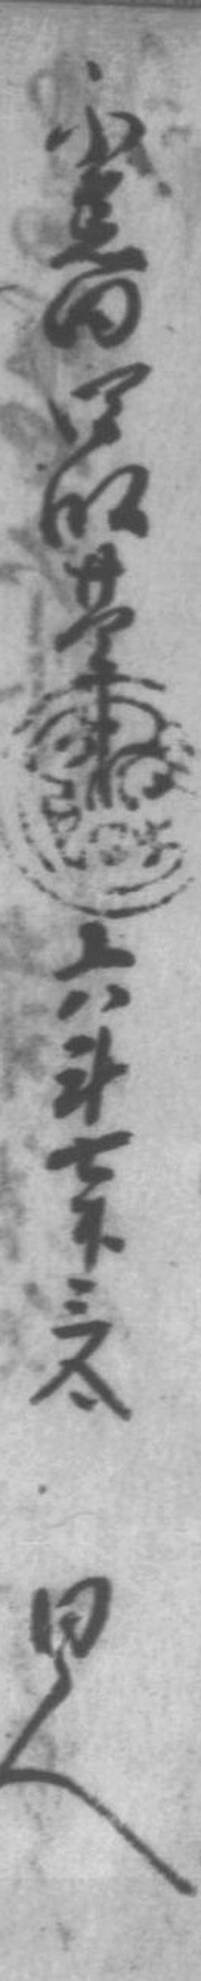ふ荒田四畝廿四分㊞六斗七升三合同人
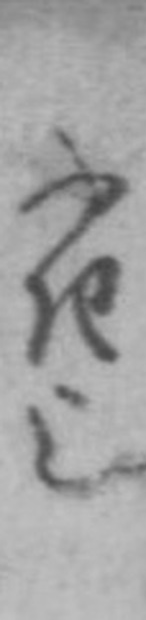ふき上

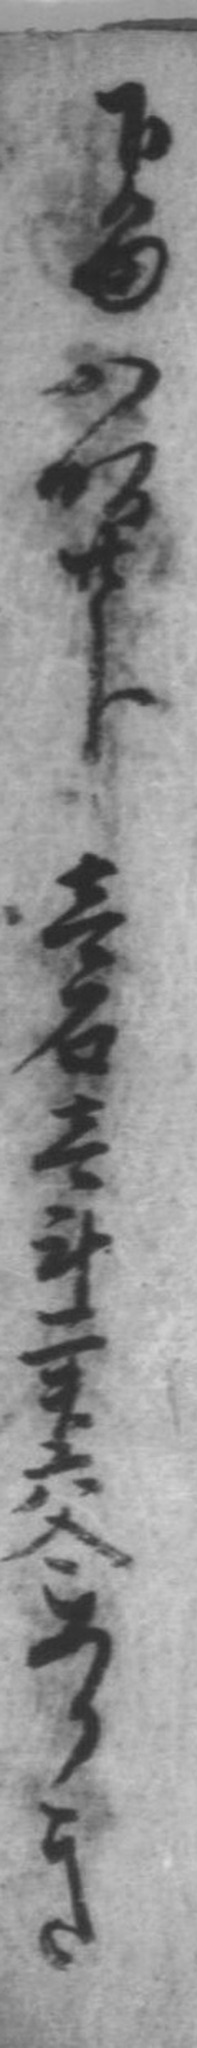下畠八畝廿分壱石壱斗二升六合ありき
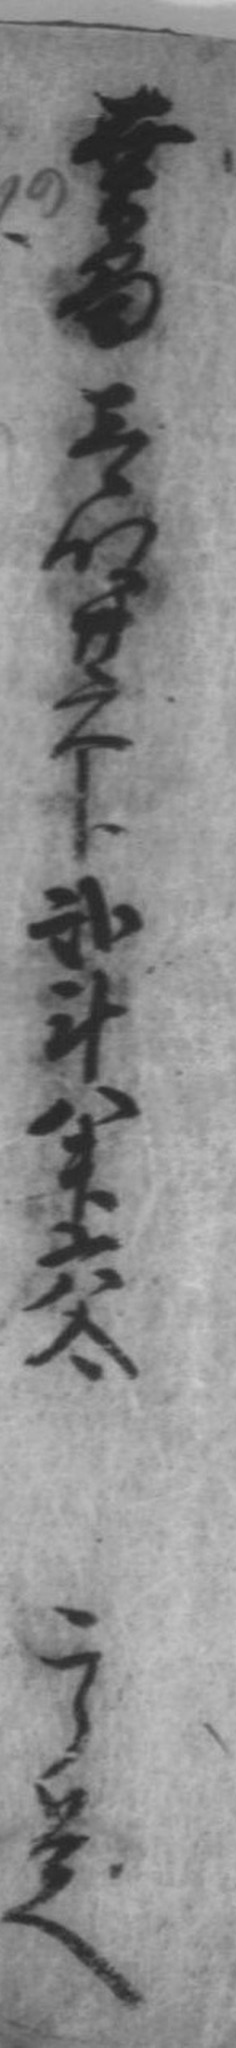桑畠壱畝廿六分弐斗八升六合二郎兵衛
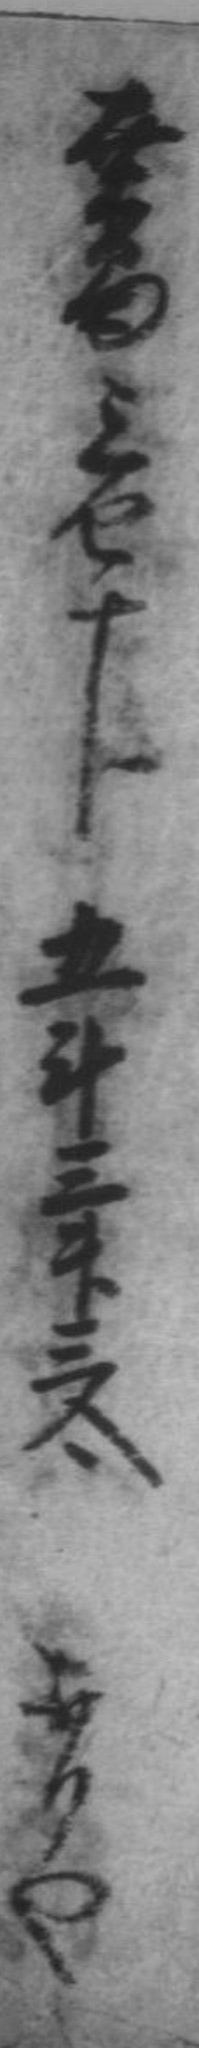桑畠三せ十分五斗三升三合おりや
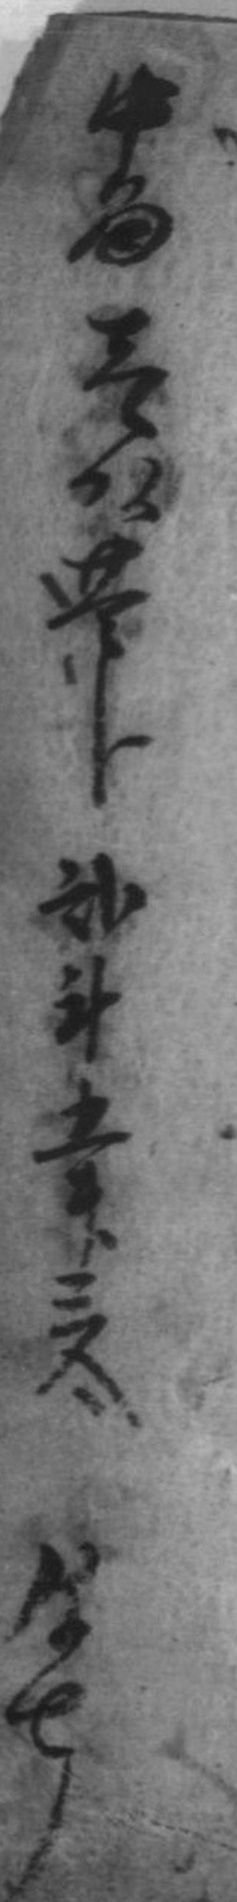中畠壱畝廿一分弐斗五升三合弥七郎

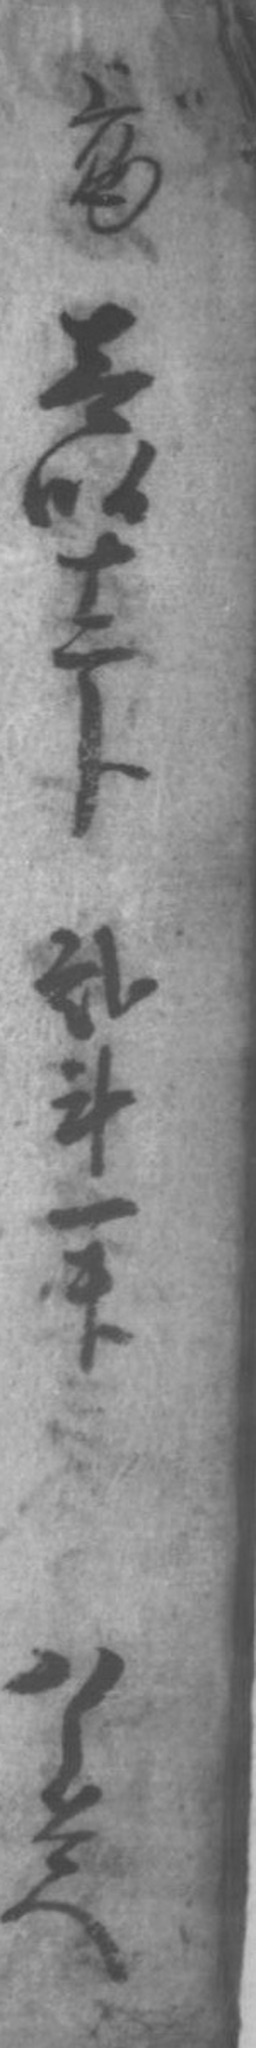上畠壱畝十二分弐斗一升八郎兵衛
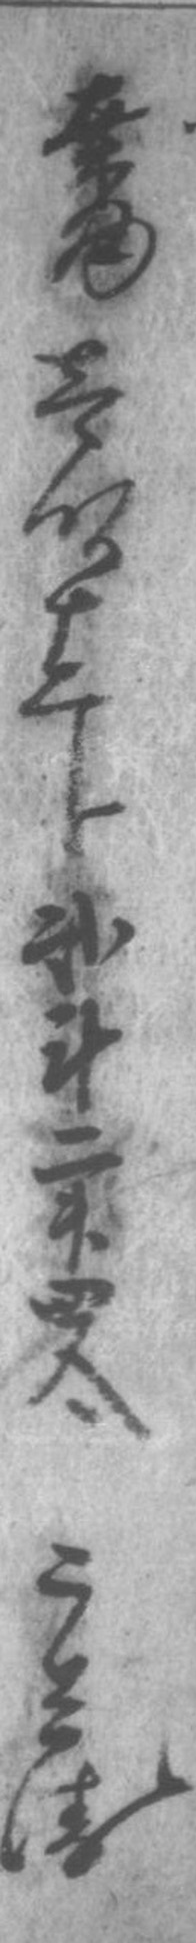桑畠壱畝十二分弐斗二升四合二兵衛
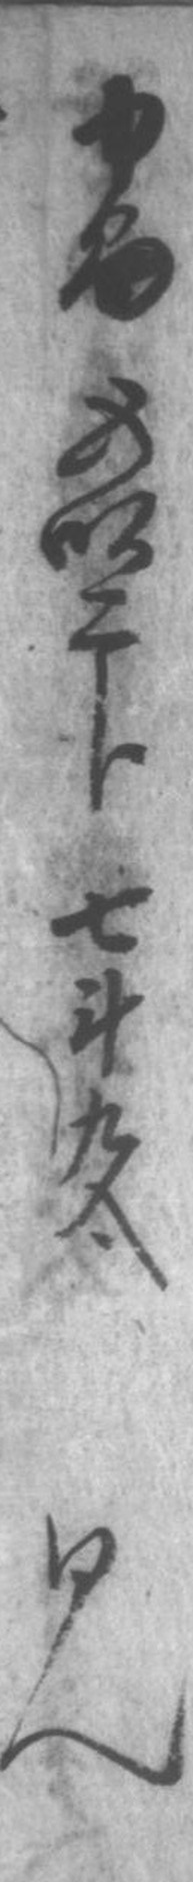中畠五畝二分七斗九合同人
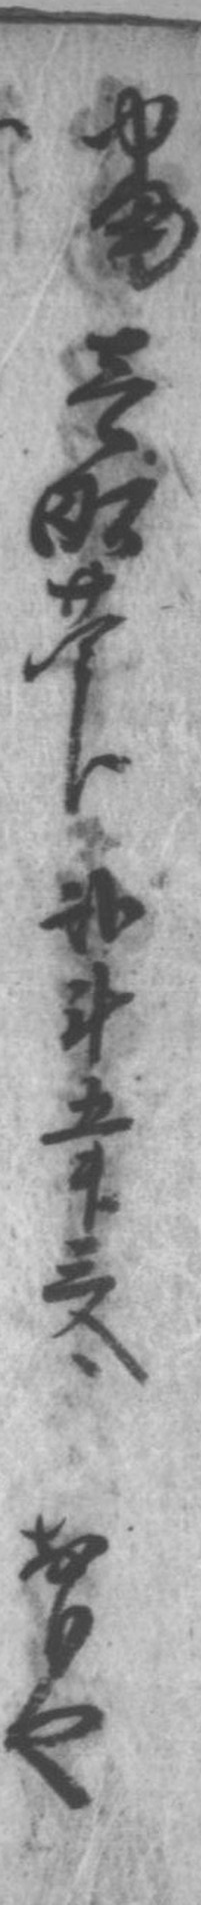中畠壱畝廿一分弐斗五升三合おりや
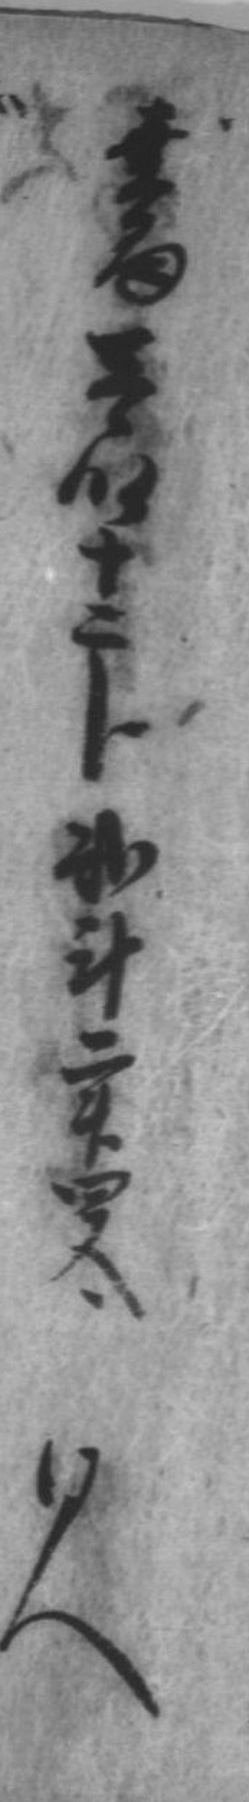桑畠壱畝十二分弐斗二升四合同人
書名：越州大野郡ノ内不動堂村御検地帳
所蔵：福井県文書館 Fukui Prefectural Archives
